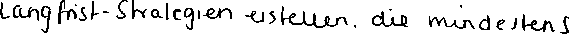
Langfrist-Strategien erstellen, die mindestens
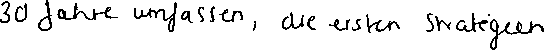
30 Jahre umfassen; die ersten Strategien
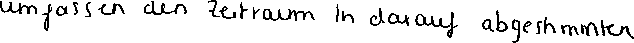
umfassen den Zeitraum In darauf abgestimmten
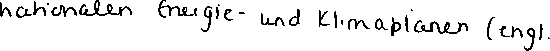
nationalen Energie- und Klimaplänen (engl.
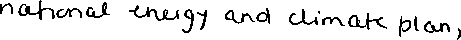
national energy and climate plan,
